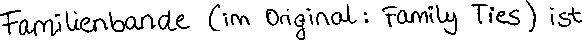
Familienbande (im Original: Family Ties) ist
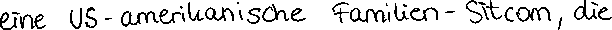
eine US-amerikanische Familien-Sitcom, die
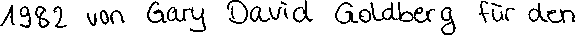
1982 von Gary David Goldberg für den
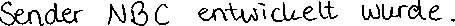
Sender NBC entwickelt wurde.
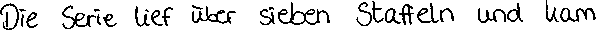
Die Serie lief über sieben Staffeln und kam
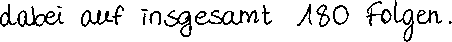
dabei auf insgesamt 180 Folgen.
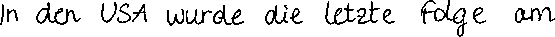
In den USA wurde die letzte Folge am
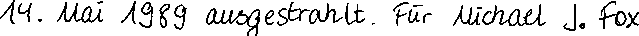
14. Mai 1989 ausgestrahlt. Für Michael J. Fox
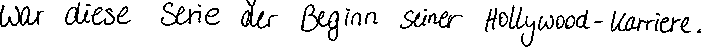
war diese Serie der Beginn seiner Hollywood-Karriere.
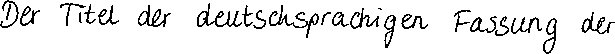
Der Titel der deutschsprachigen Fassung der
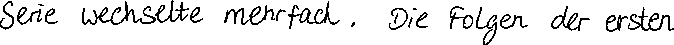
Serie wechselte mehrfach. Die Folgen der ersten
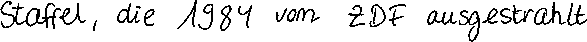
Staffel, die 1984 vom ZDF ausgestrahlt
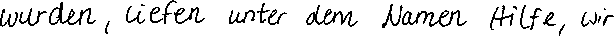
wurden, liefen unter dem Namen Hilfe, wir
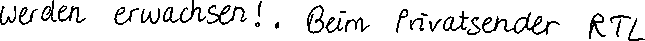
werden erwachsen!. Beim Privatsender RTL
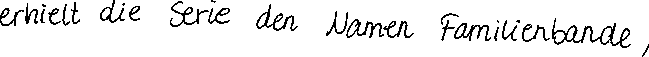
erhielt die Serie den Namen Familienbande,
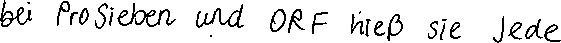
bei ProSieben und ORF hieß sie Jede
